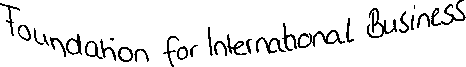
Foundation for International
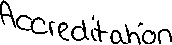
Accreditation
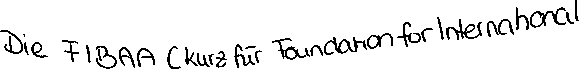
Die FIBAA (kurz für Foundation for International
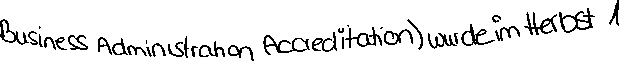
Business Administration Accreditation) wurde im Herbst 1
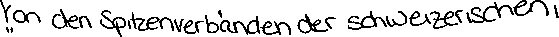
von den Spitzenverbänden der schweizerischen,
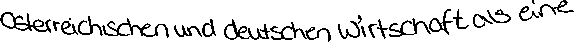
österreichischen und deutschen Wirtschaft als eine
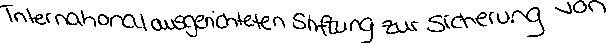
International ausgerichtete Stiftung zur Sicherung von
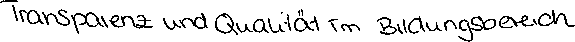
Transparenz und Qualität im Bildungsbereich
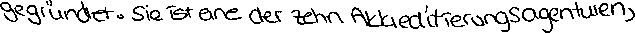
gegründet. Sie ist eine der zehn Akkreditierungsagenturen,
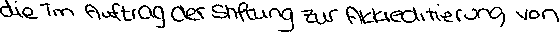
die im Auftrag der Stiftung zur Akkreditierung von
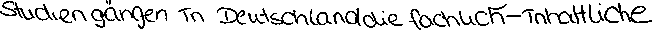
Studiengängen in Deutschland die fachlich-inhaltliche
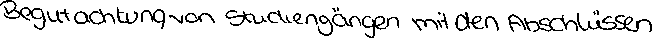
Begutachtung von Studiengängen mit den Abschlüssen
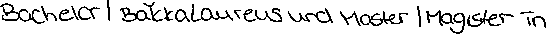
Bachelor/Bakkalaureus und Master/Magister in
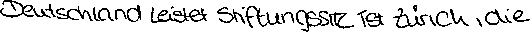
Deutschland leistet. Stiftungssitz ist Zürich, die
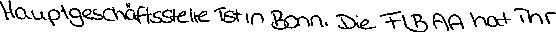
Hauptgeschäftsstelle ist in Bonn. Die FIBAA hat ihr
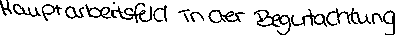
Hauptarbeitsfeld in der Begutachtung
